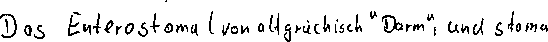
Das Enterostoma (von altgriechisch "Darm", und stoma
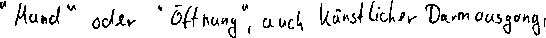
"Mund" oder "Öffnung", auch künstlicher Darmausgang,
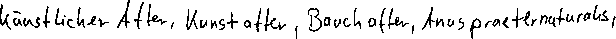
künstlicher After, Kunstafter, Bauchafter, Anus praeternaturalis,
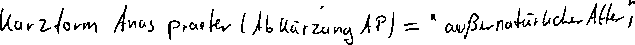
Kurzform Anus praeter (Abkürzung AP) = "außernatürlicher After",
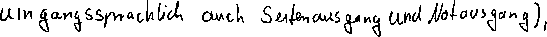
umgangssprachlich auch Seitenausgang und Notausgang),
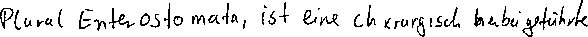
Plural Enterostomata, ist eine chirurgisch herbeigeführte
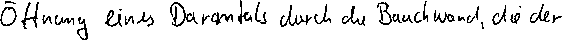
Öffnung eines Darmteils durch die Bauchwand, die der
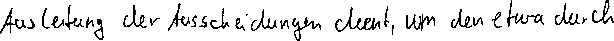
Ausleitung der Ausscheidungen dient, um den etwa durch
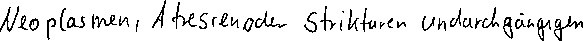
Neoplasmen, Atresien oder Strikturen undurchgängigen
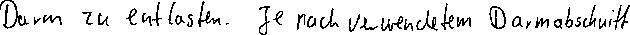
Darm zu entlasten. Je nach verwendetem Darmabschnitt
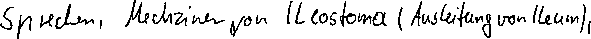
sprechen Mediziner von Ileostoma (Ausleitung vom Ileum),
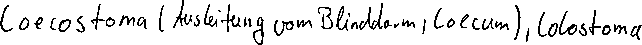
Coecostoma (Ausleitung vom Blinddarm, Coecum), Colostoma
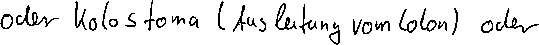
oder Kolostoma (Ausleitung vom Colon) oder
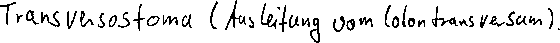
Transversostoma (Ausleitung vom Colon transversum).
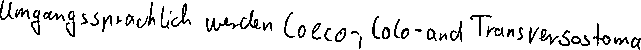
Umgangssprachlich werden Coeco-, Colo- und Transversostoma
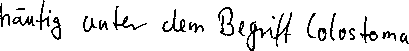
häufig unter dem Begriff Colostoma
